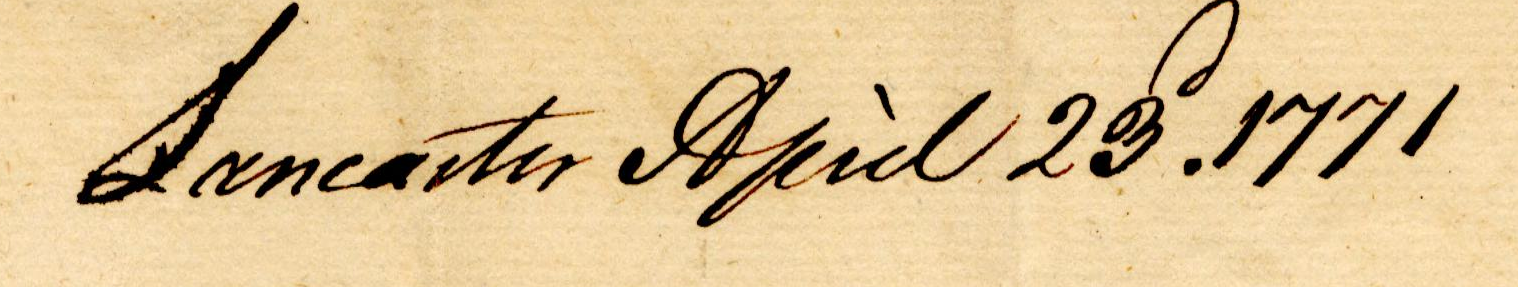Lancaster April 23^d. 1771
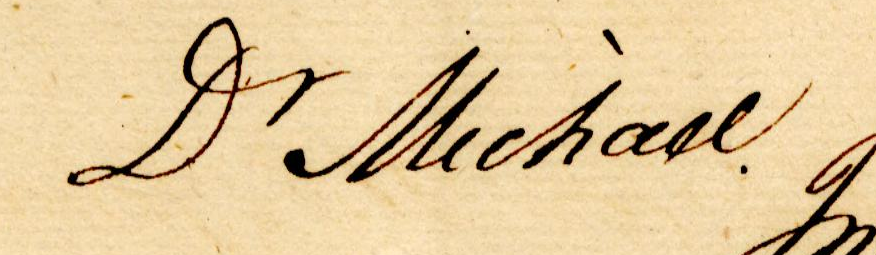D^r Michael
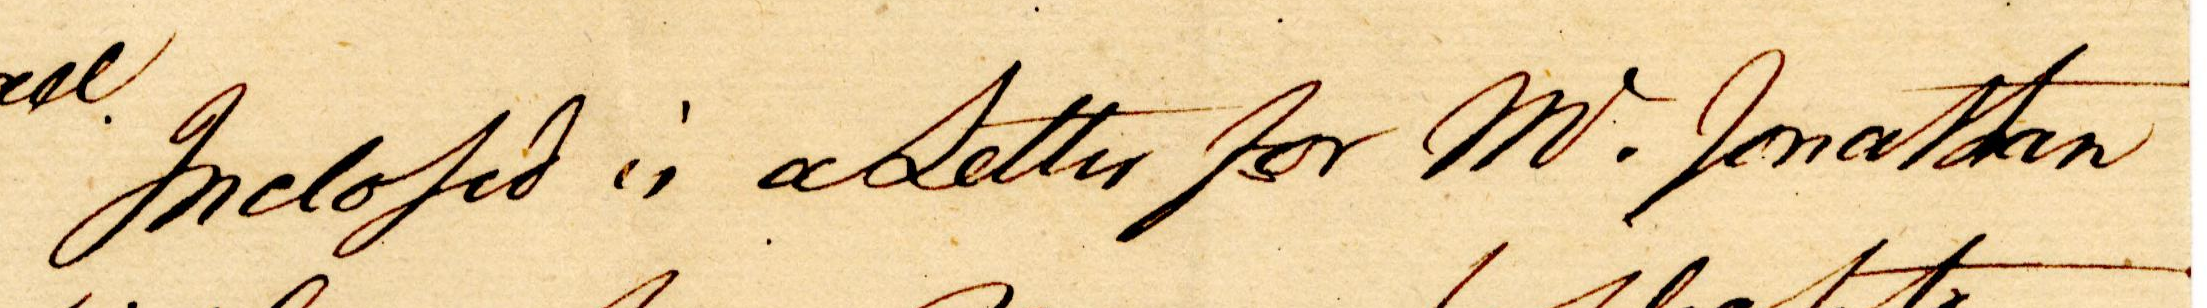Inclosed is a Letter for M^r. Jonathan
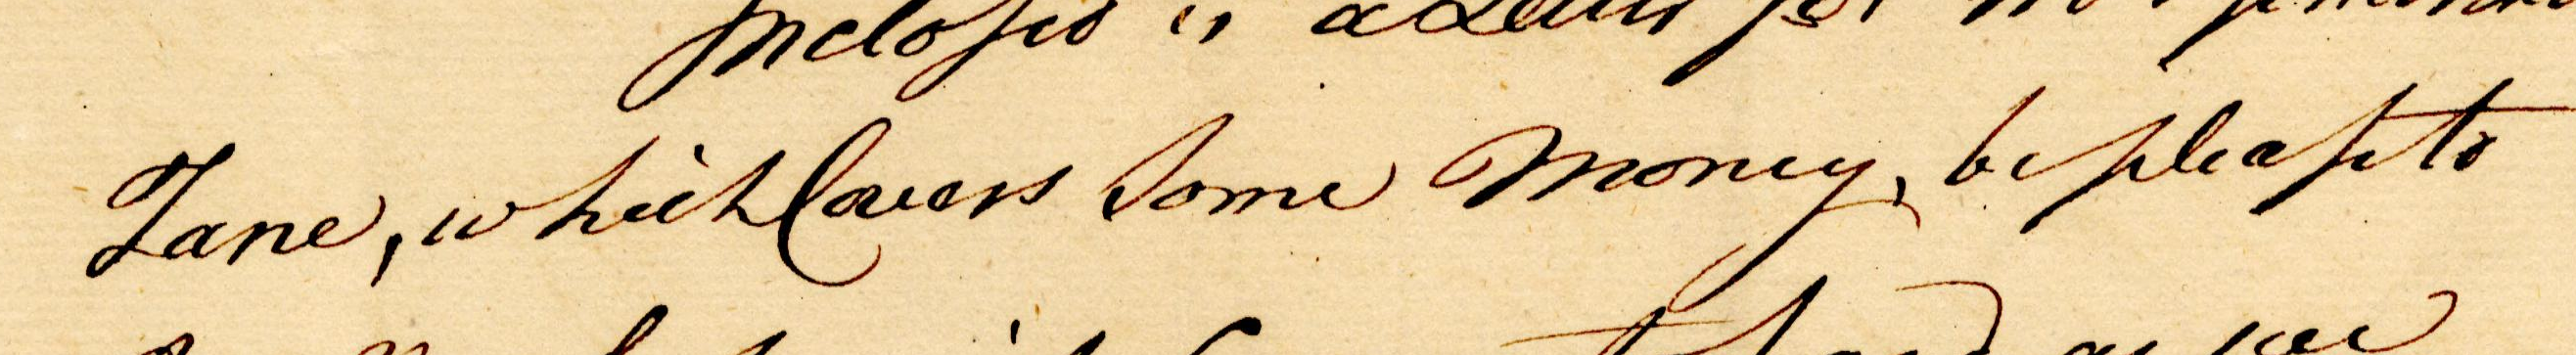Lane, which Covers Some Money, be please to
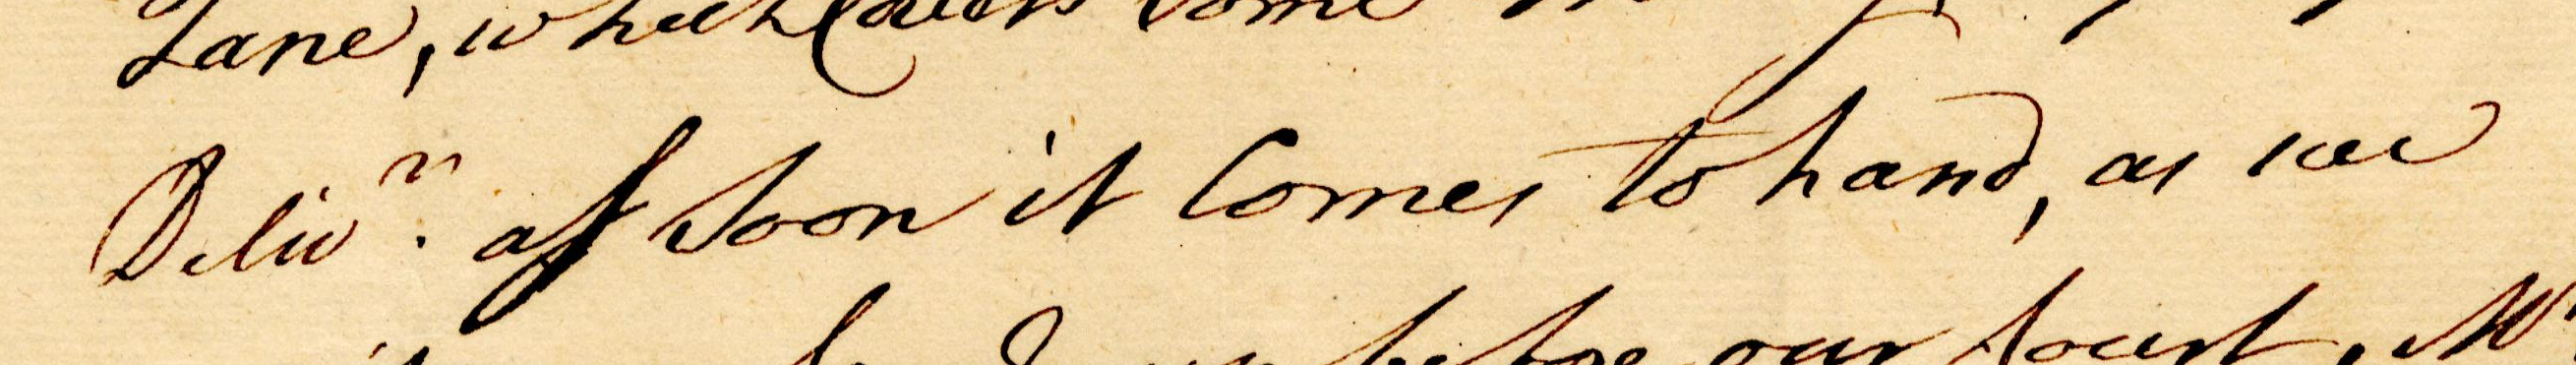Deliv^r. as soon it comes to hand, as we
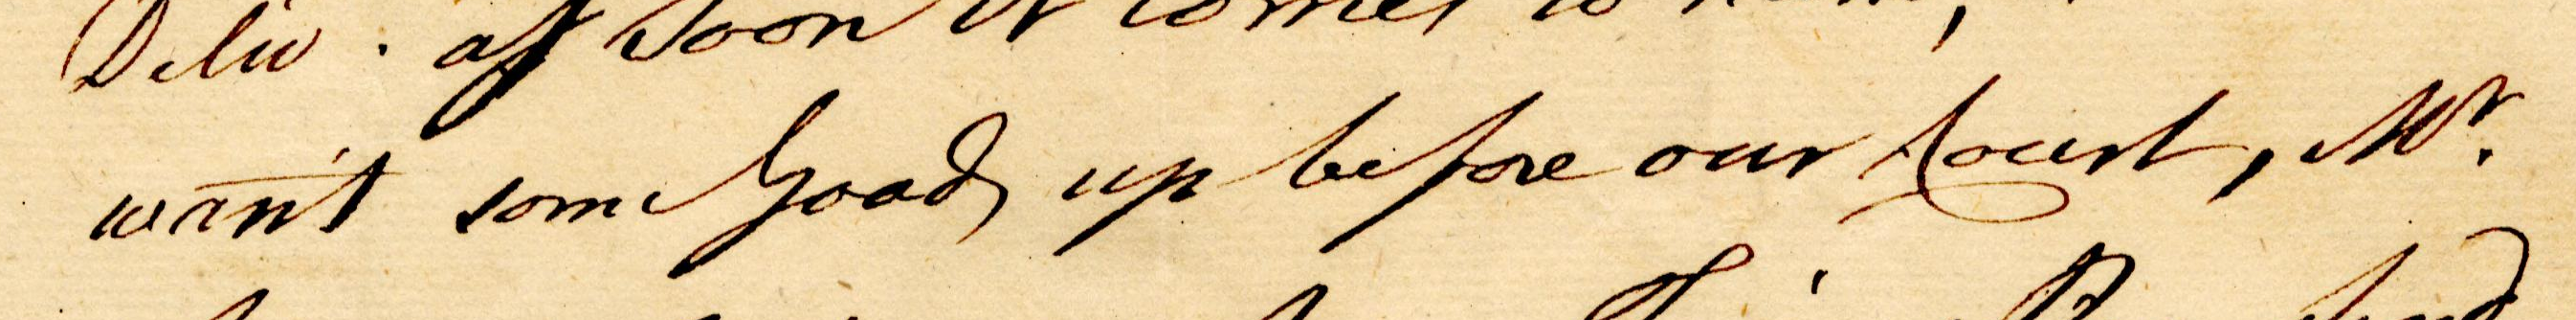want som Goods up before our Court, M^r.
